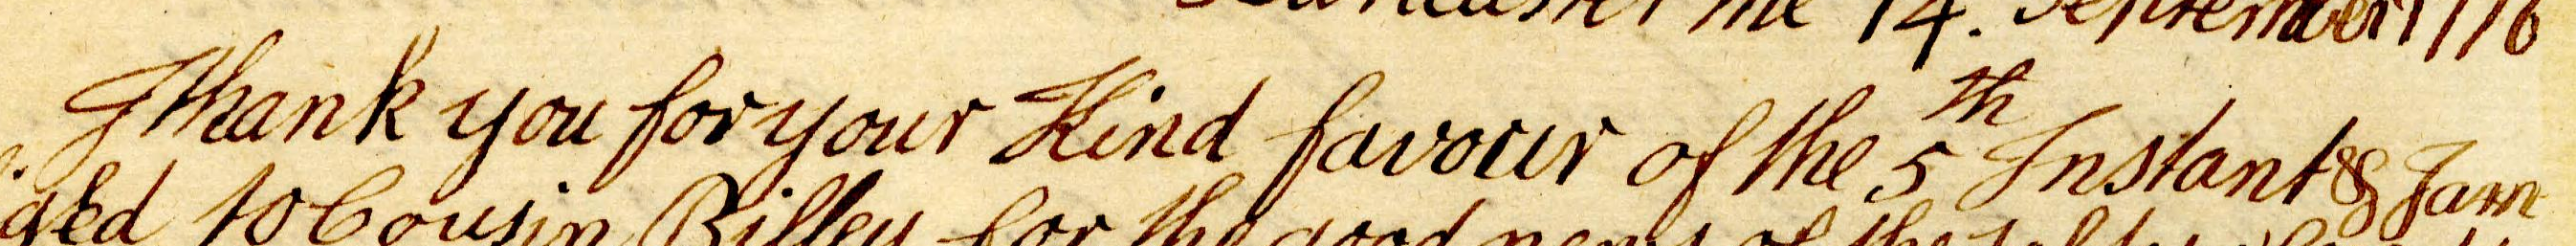Thank you for your Kind favour of the 5^th Instant & I am
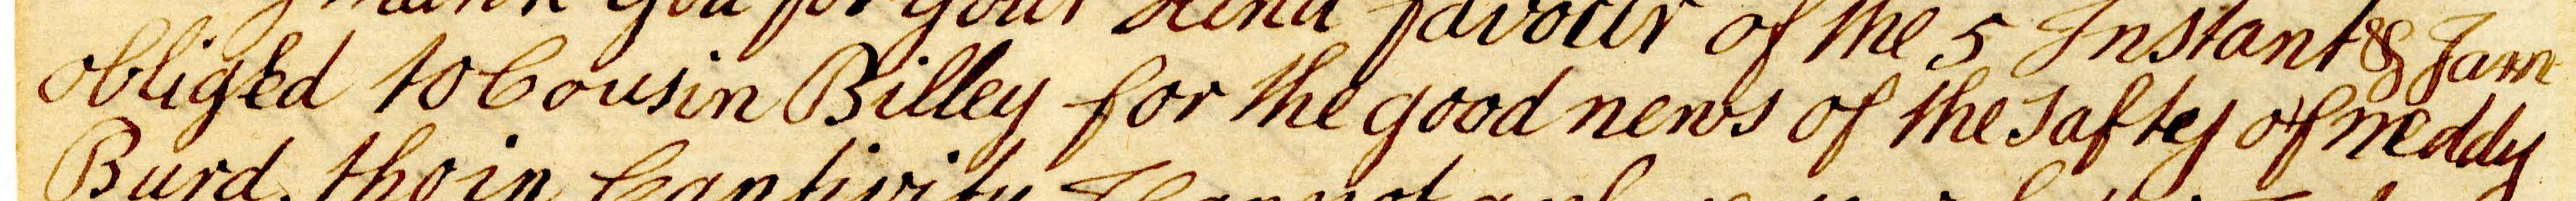obliged to Cousin Billey for the good news of the saftey of Neddy
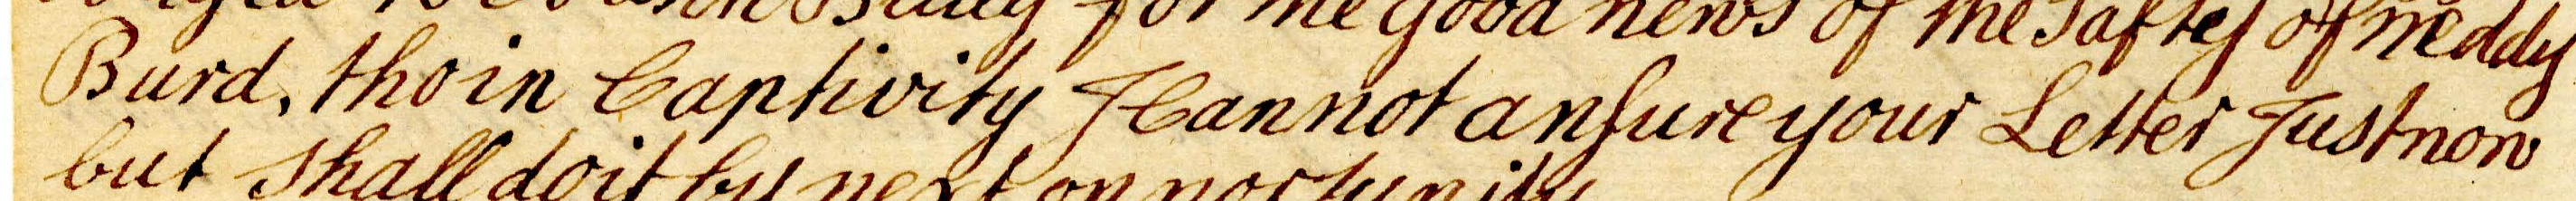Burd, tho in Captivity I Cannot ansure your Letter Just now
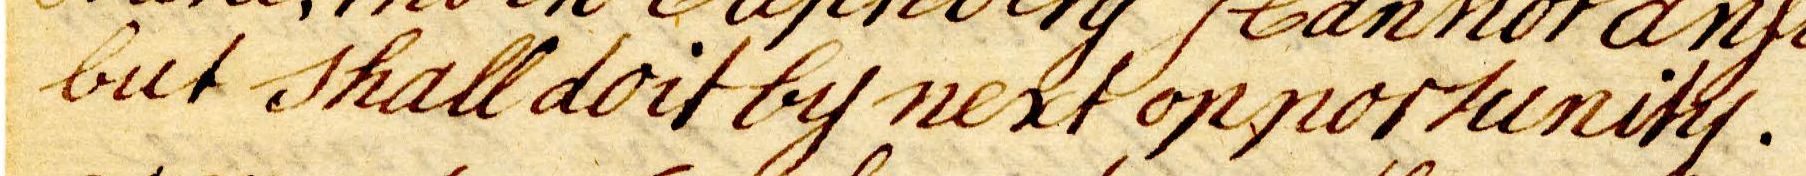but shall doit by next opportunity.
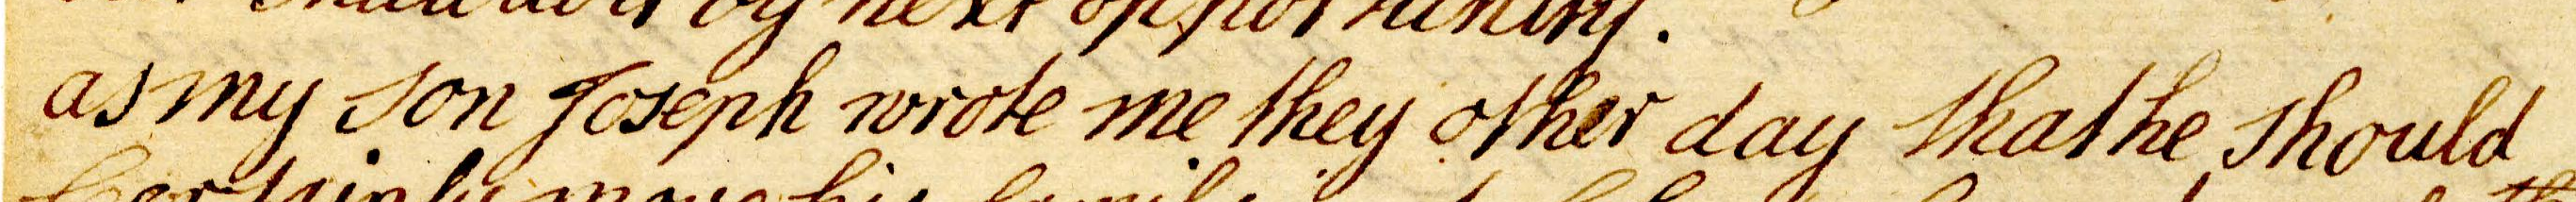as my son Joseph wrote me they other day that he should
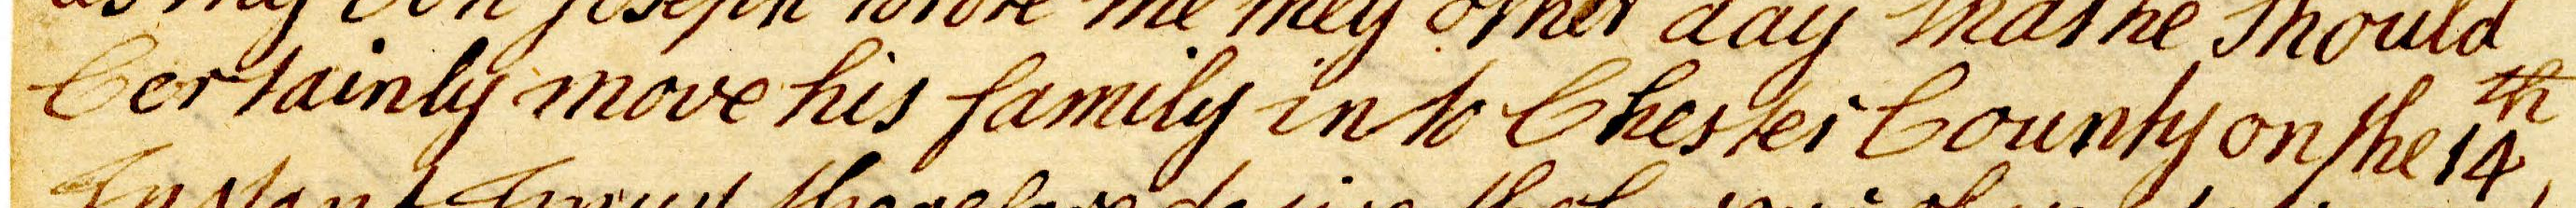Certainly move his family in to Chester County on the 14^th.
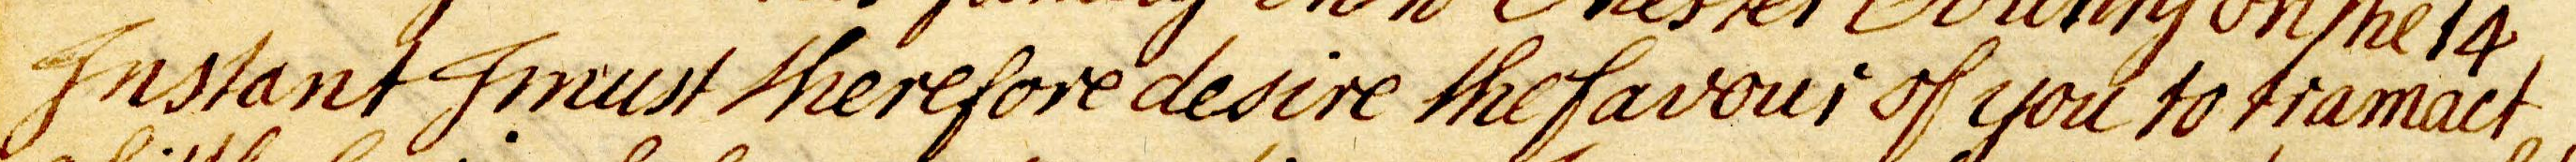Instant I must therefore desire the favour of you to tramact
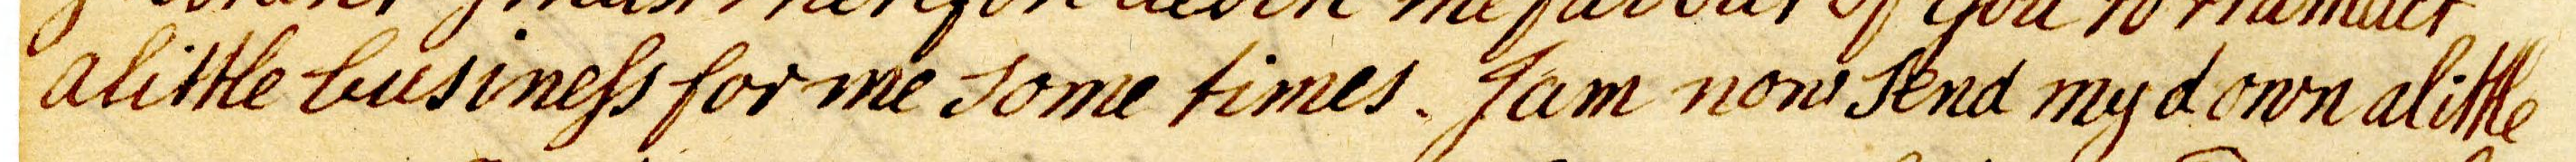alittle business for me some times. I am now send my down alittle
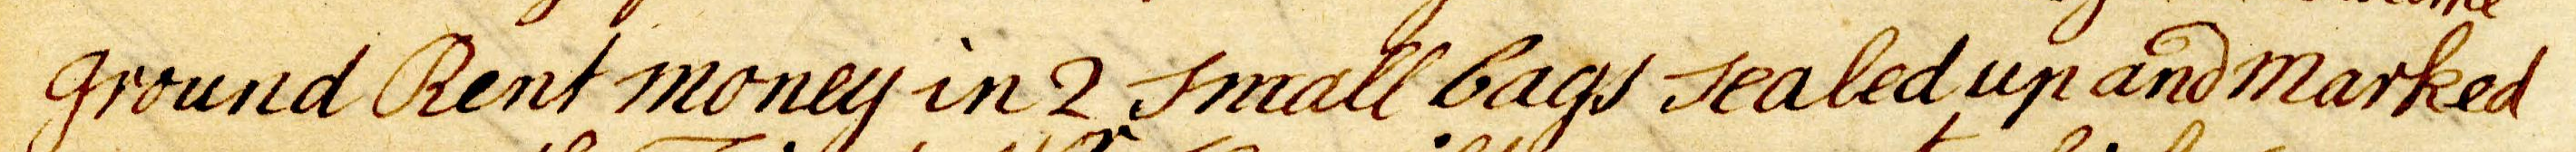ground Rent money in 2 small bags sealed up and Marked
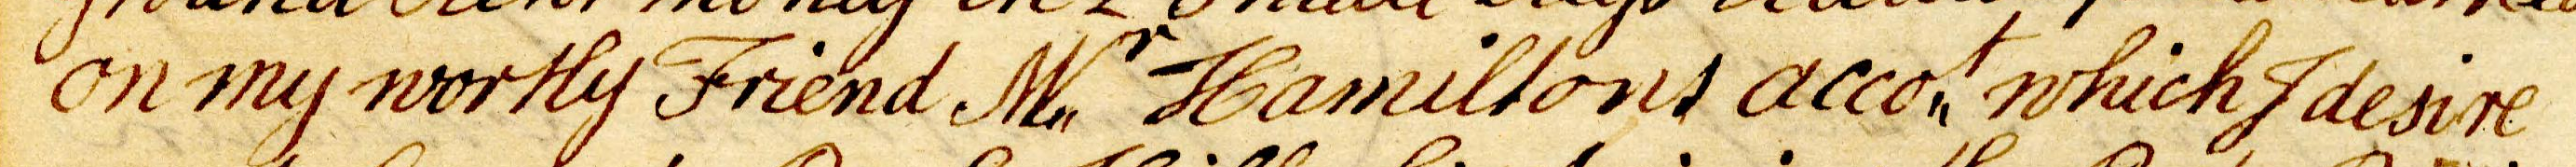on my worthy Friend M^r Hamiltons acco^t. which I desire
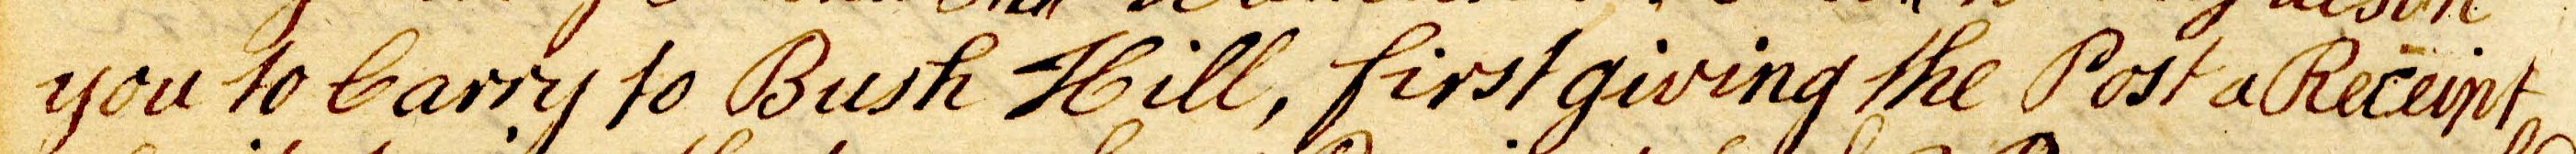you to Carry to Bush Hill, first giving the Post a Receipt
